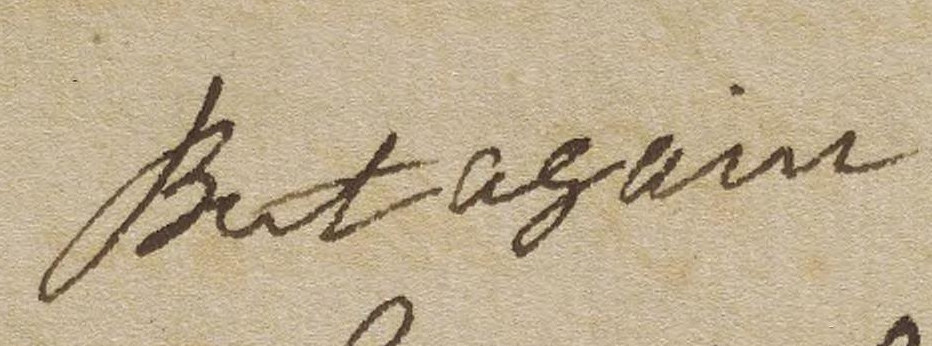But again
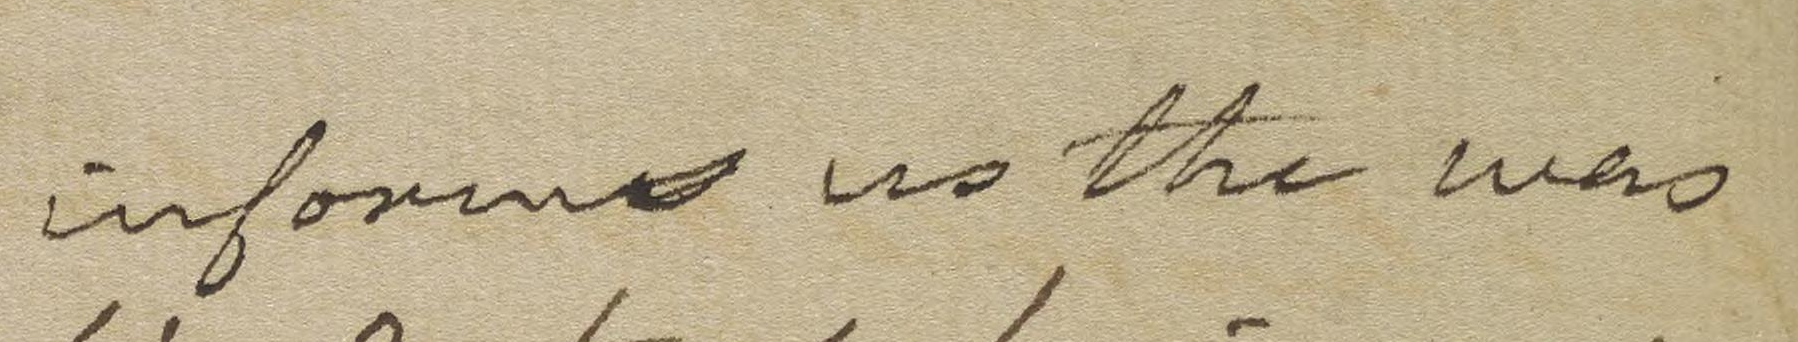informs us the was
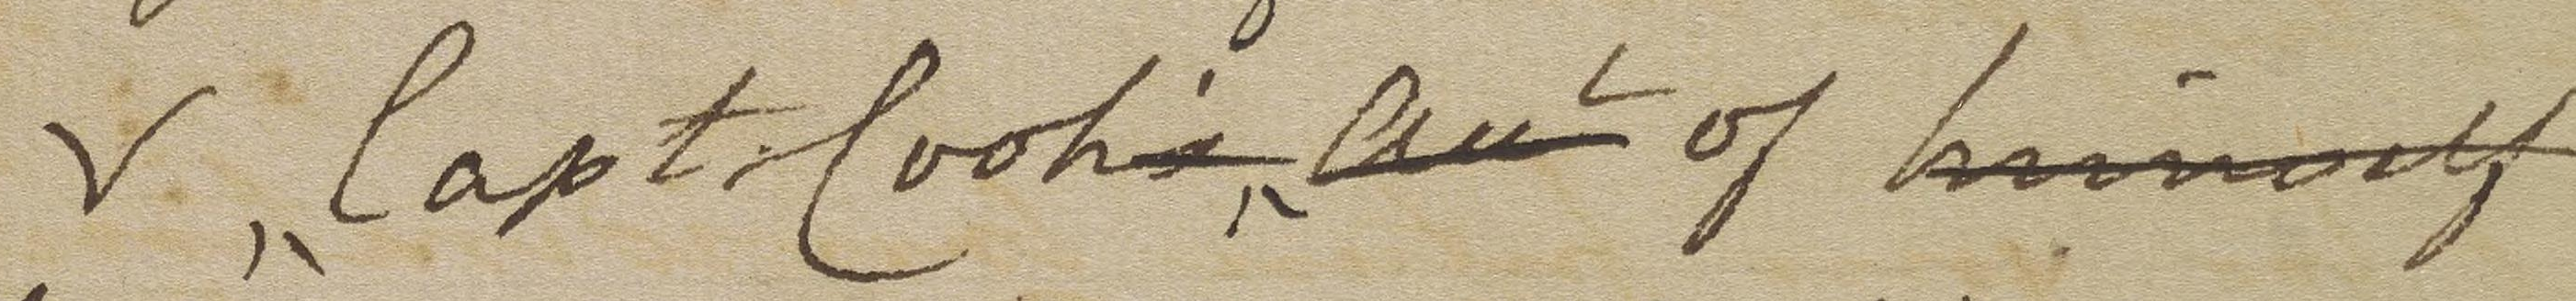V ^ Capt Cook['s] [acc^t] of [himself]
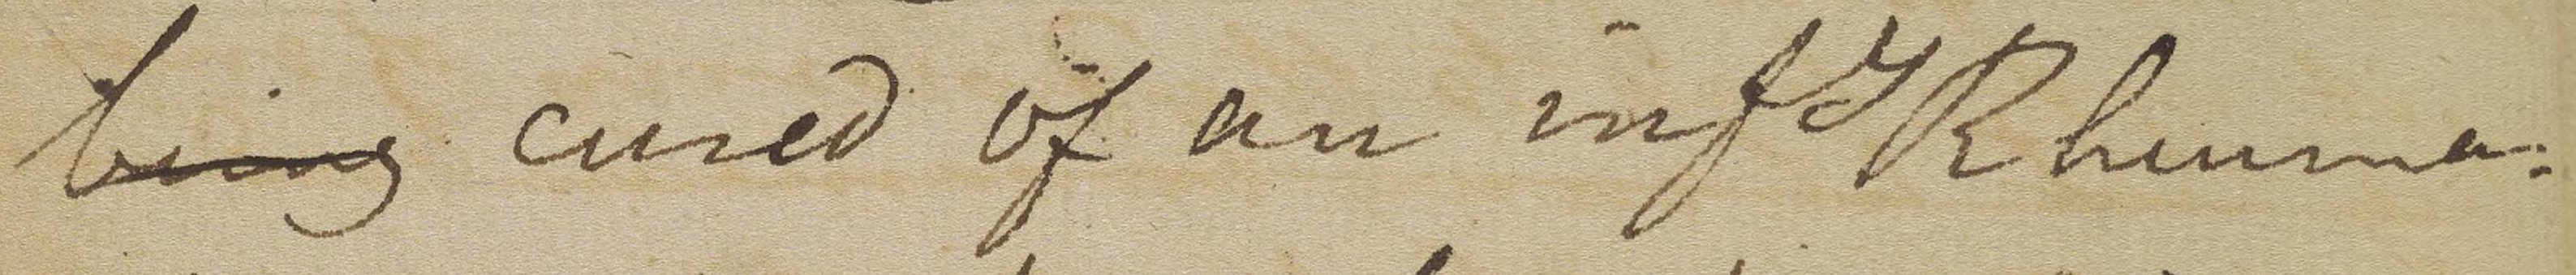[being] cured of an inf^y Rheuma-
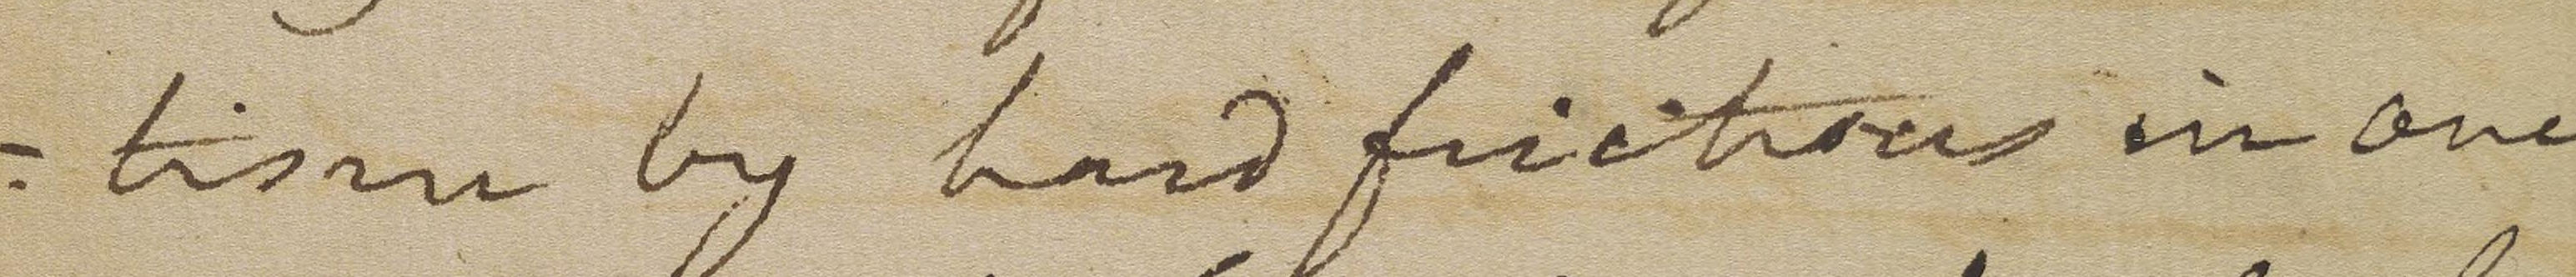-tism by the hard frictions in one
